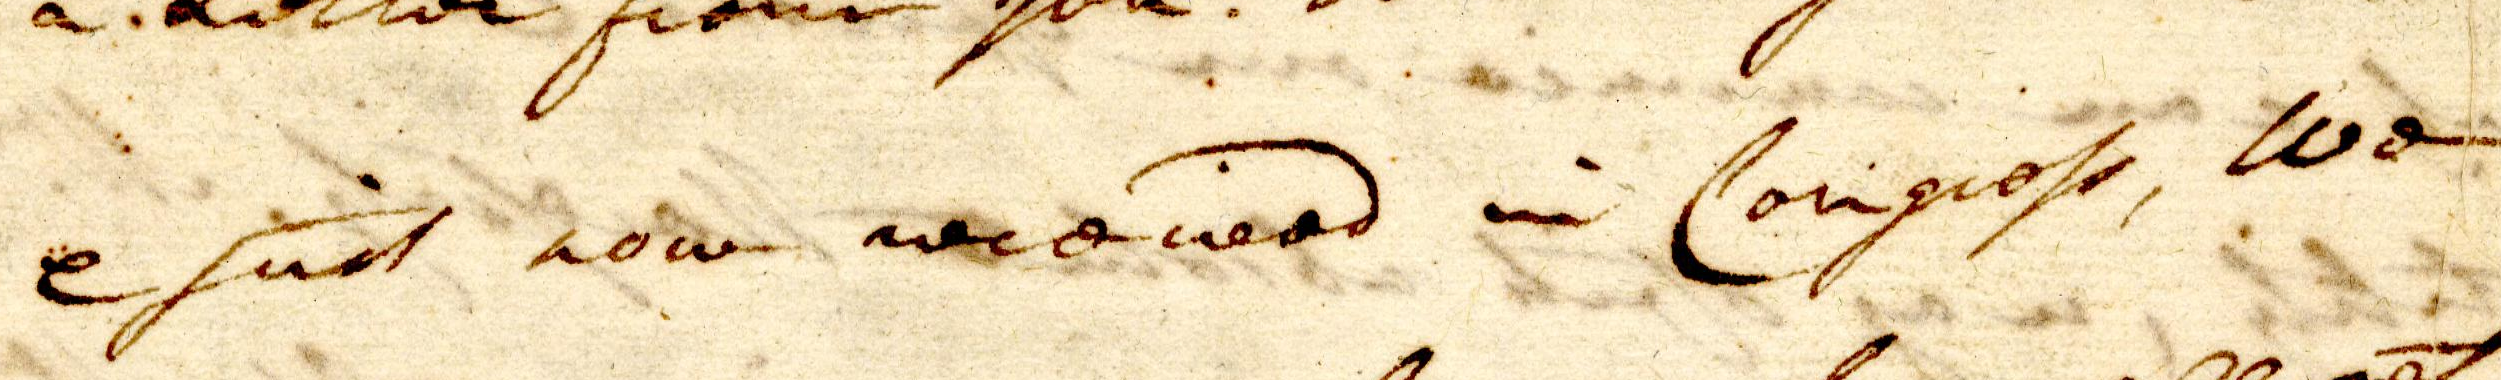& just now received in Congress, we
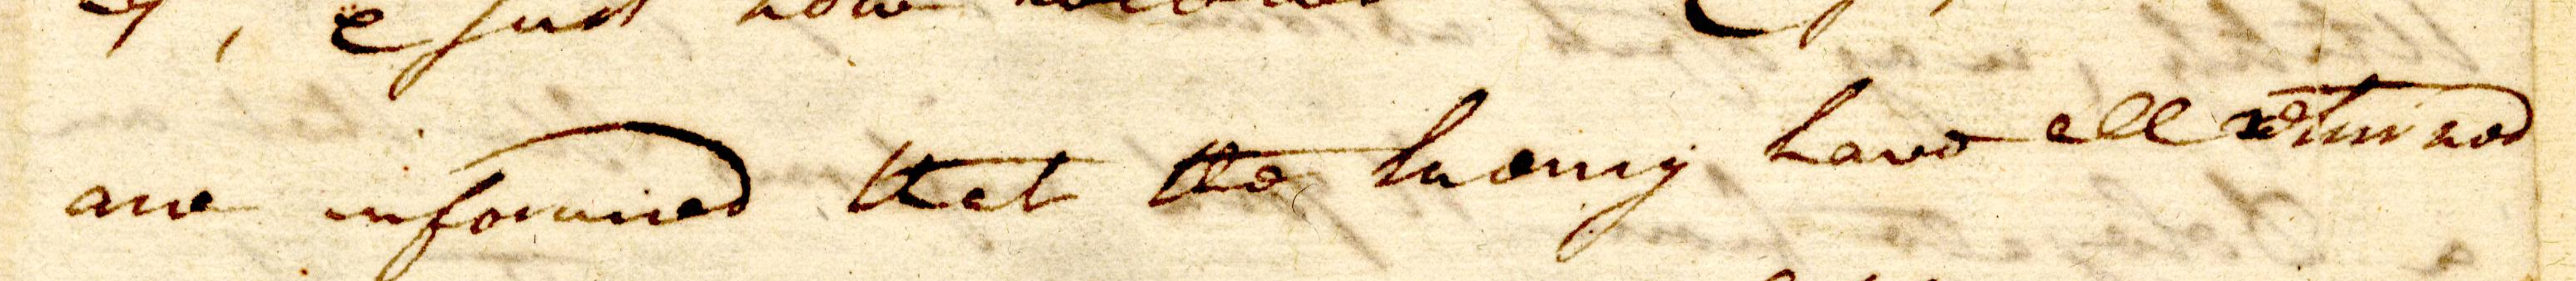are informed that the army have all returned
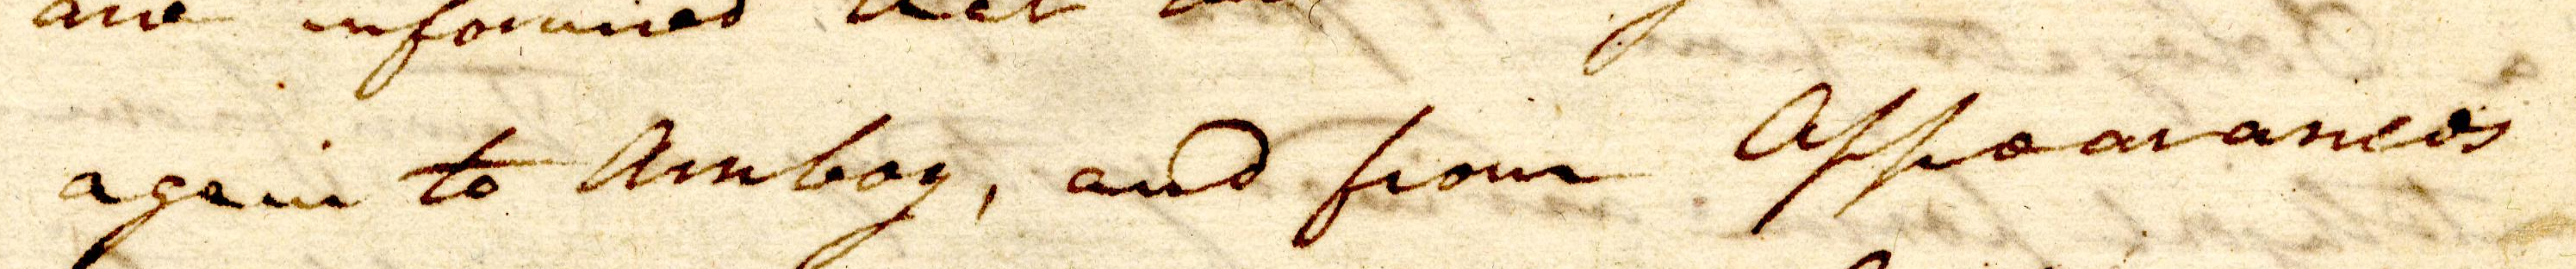again to Amboy, and from Appearances
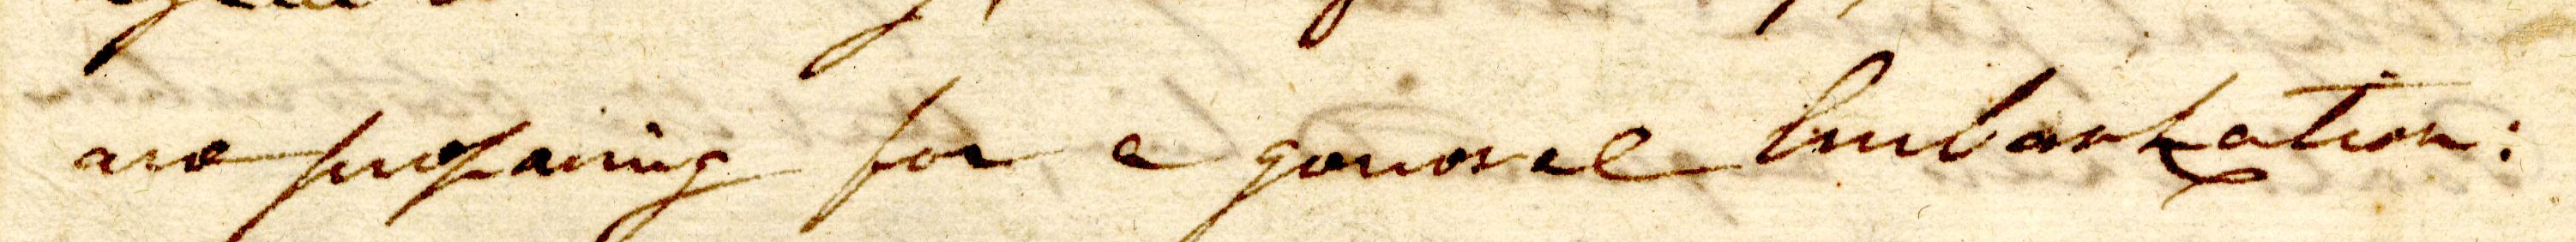are proposing for a general Embarkation:
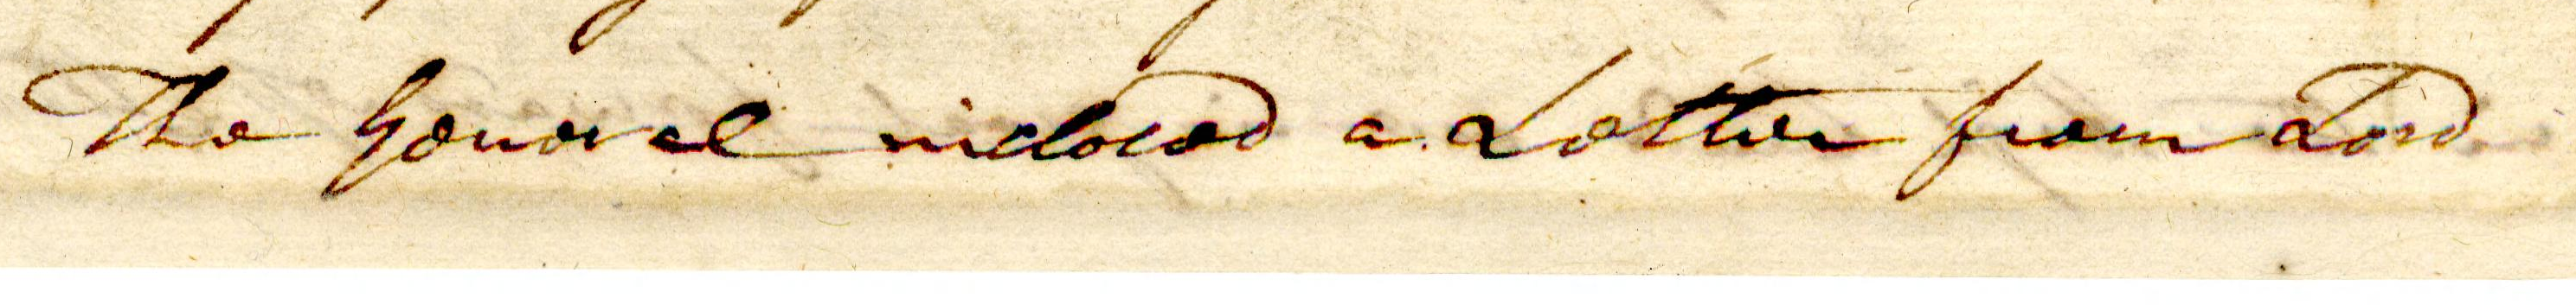The General inclosed a Letter from Lord
